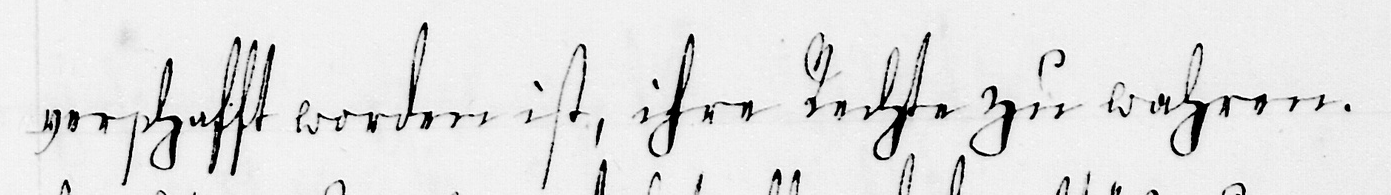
verschafft worden ist, ihre Rechte zu wahren.
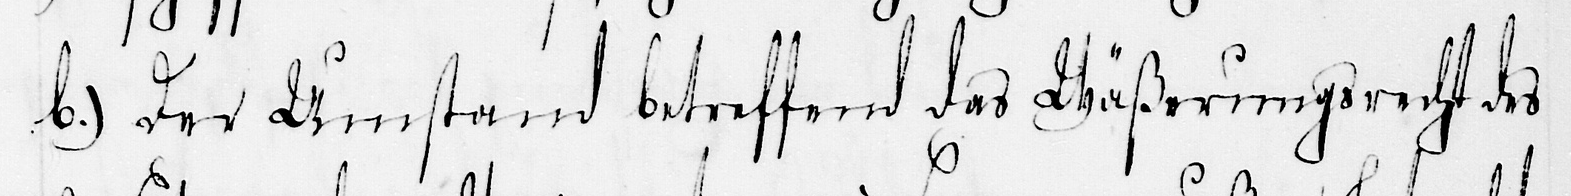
b.) Der Umstand betreffend das Wäßerungsrecht des
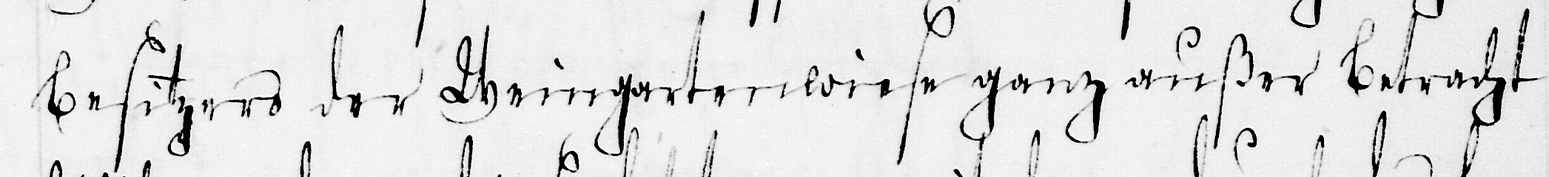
Besitzers der Weingartenwiese ganz außer Betracht
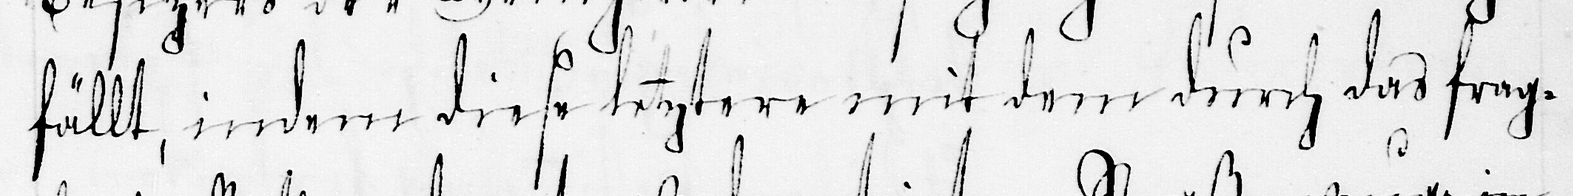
fällt, indem diese letztere mit dem durch das frag¬
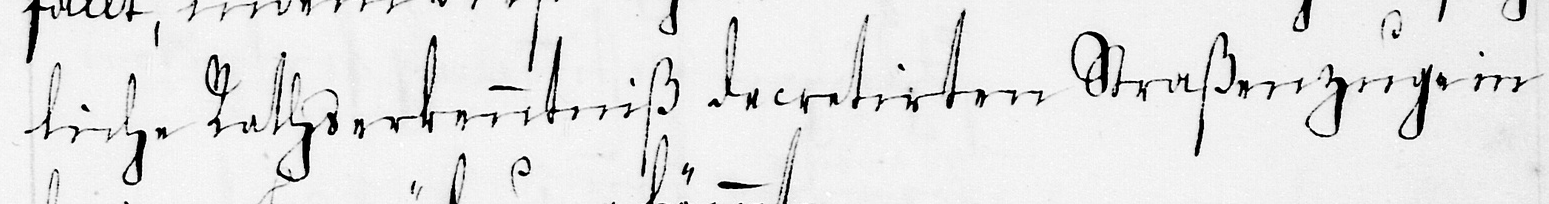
liche Rathserkenntniß decretirten Straßenzuge in
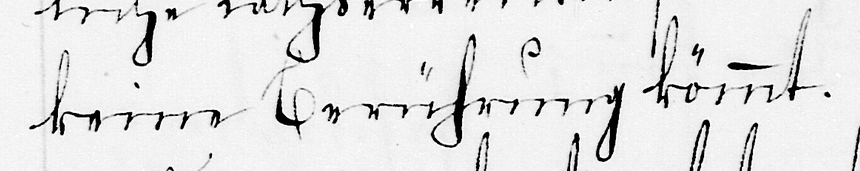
keine Berührung kömmt.
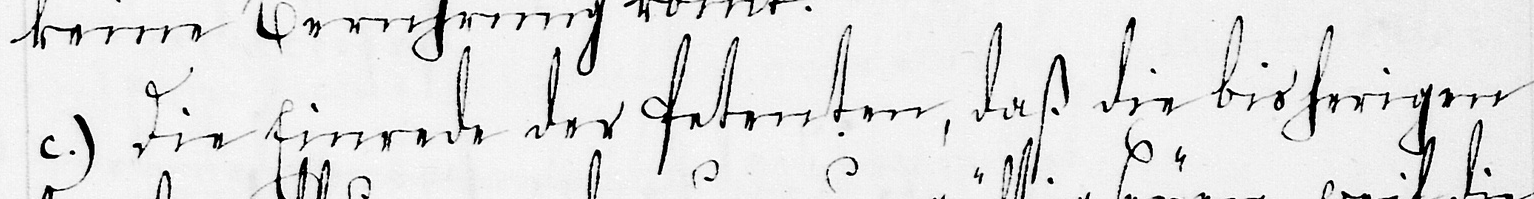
c.) Die Einrede der Petenten, daß die bisherigen
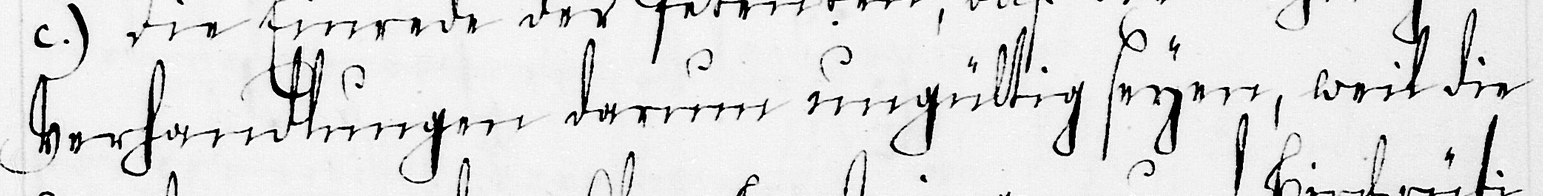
Verhandlungen darum ungültig seyen, weil die
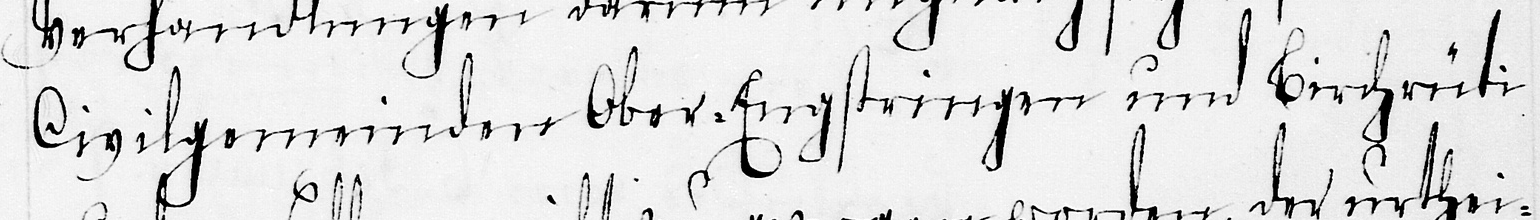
Civilgemeinden Ober-Engstringen und Birchrüti
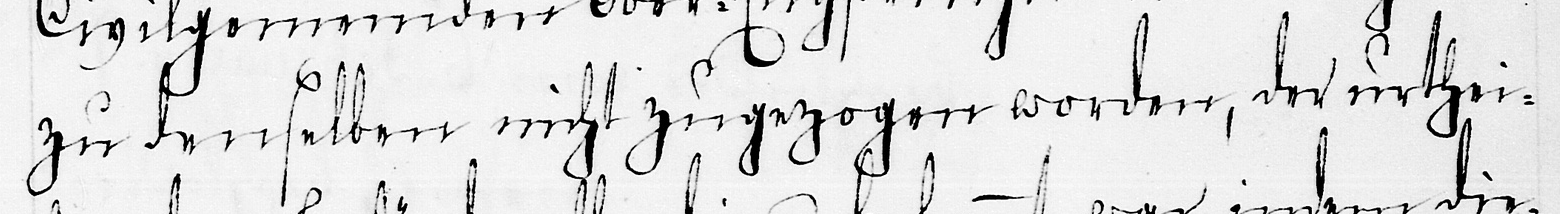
zu denselben nicht zugezogen worden, der urthei¬
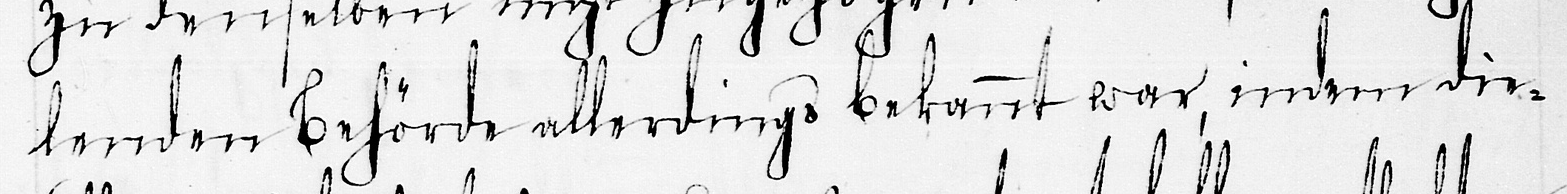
lenden Behörde allerdings bekannt war, indem die¬
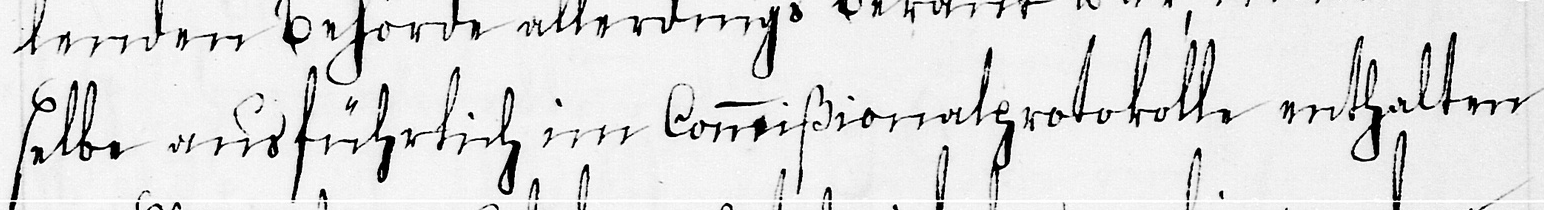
selbe ausführlich im Commißionalprotokolle enthalten
